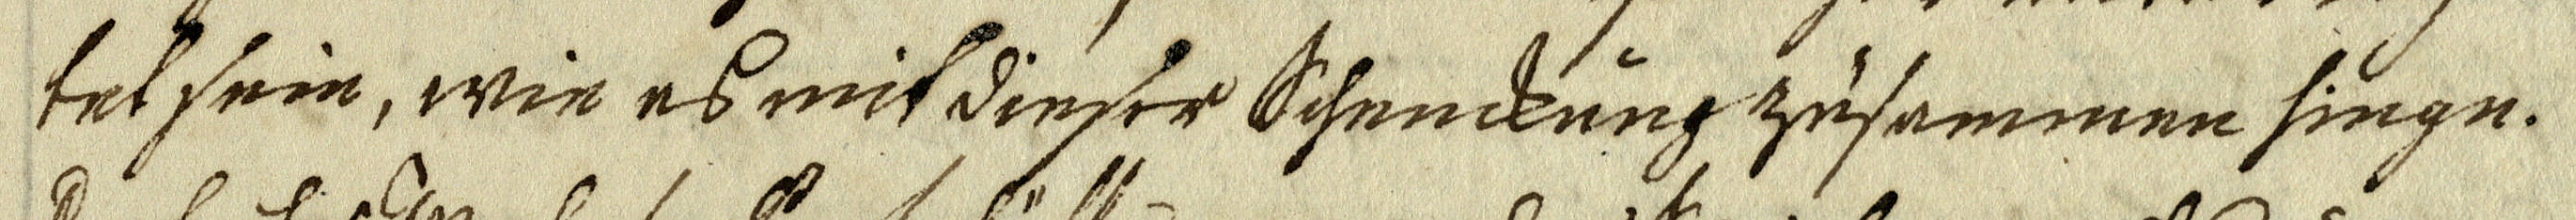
tet sein, wie es mit dieser Schenckung zusammen hinge.
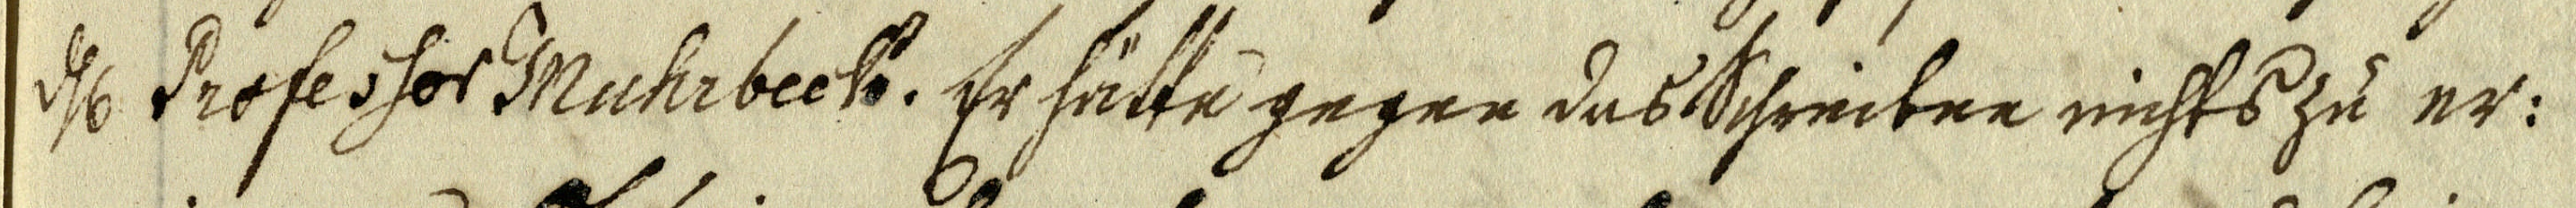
dh Professor Muhrbeck. Er hätte gegen das Schreiben nichts zu er¬
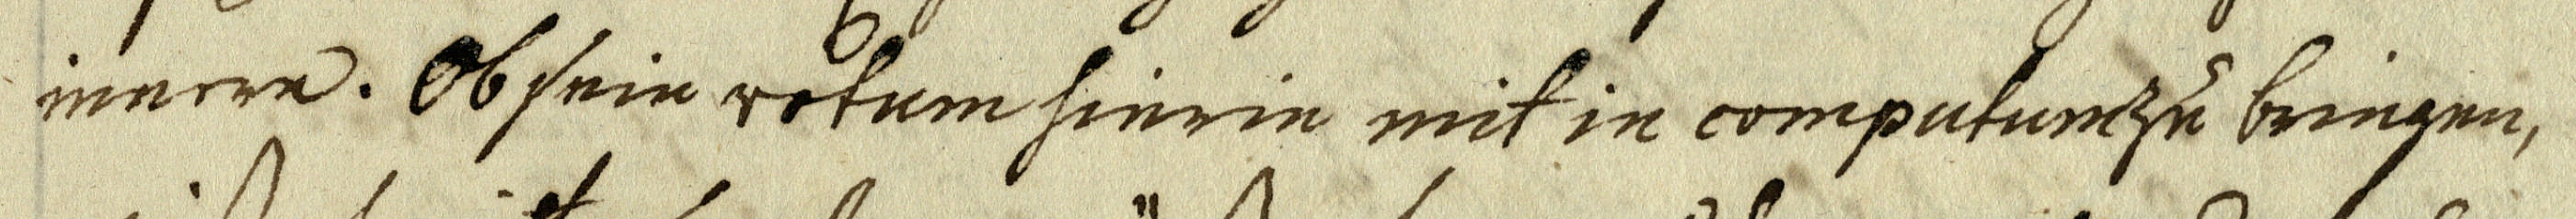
innern. Ob sein votum hierin mit in computum zu bringen,
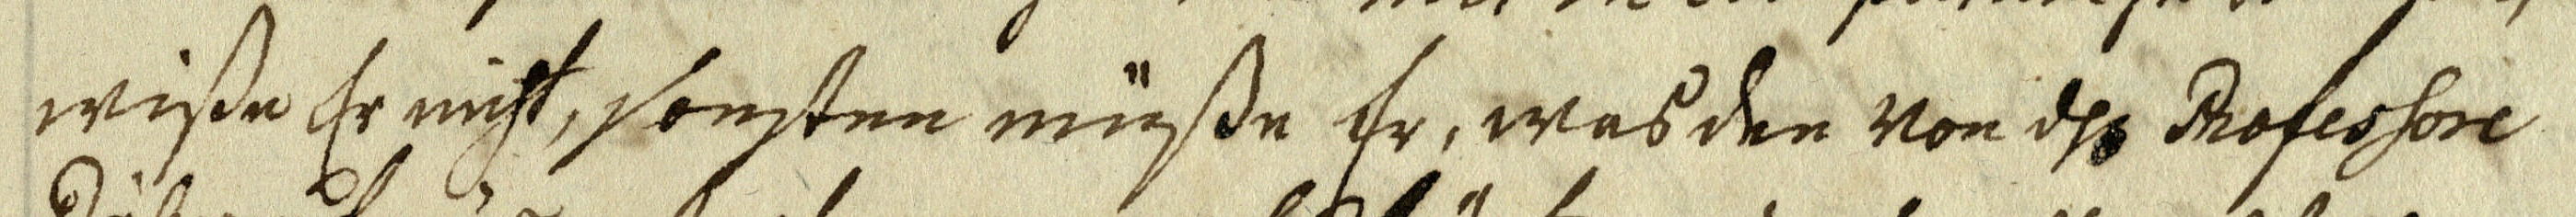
wiße Er nicht, sonsten müße Er, was den von dh Professore
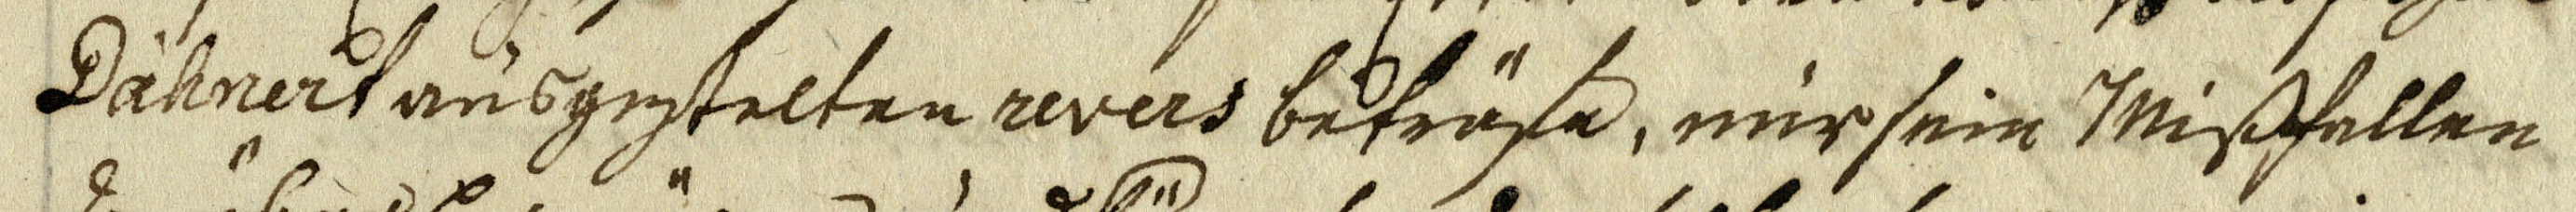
Dähnert ausgestelten revers beträfe, nur sein Mißfallen
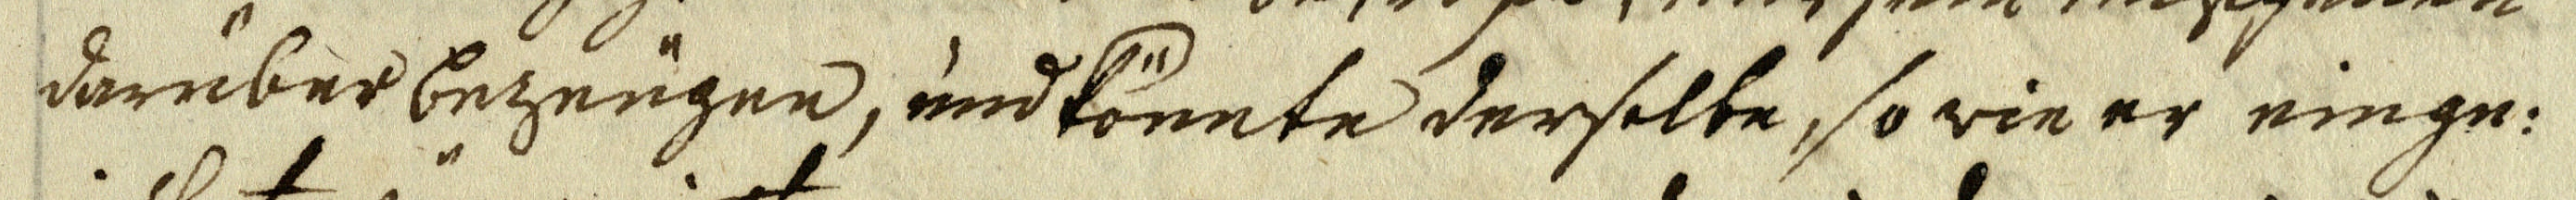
darüber bezeugen, und könnte derselbe, so wie er einge¬
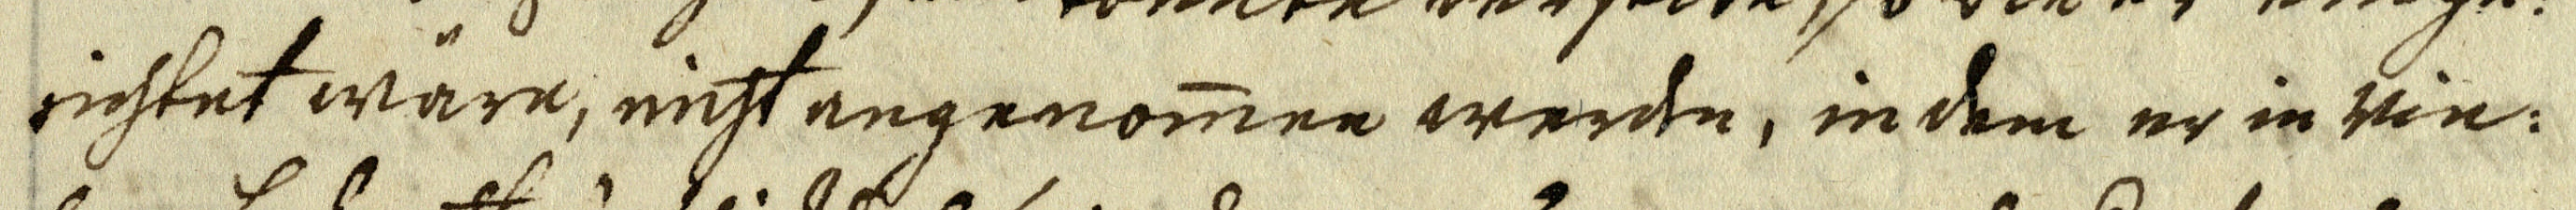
richtet wäre, nicht angenomen werden, in dem er in vie¬
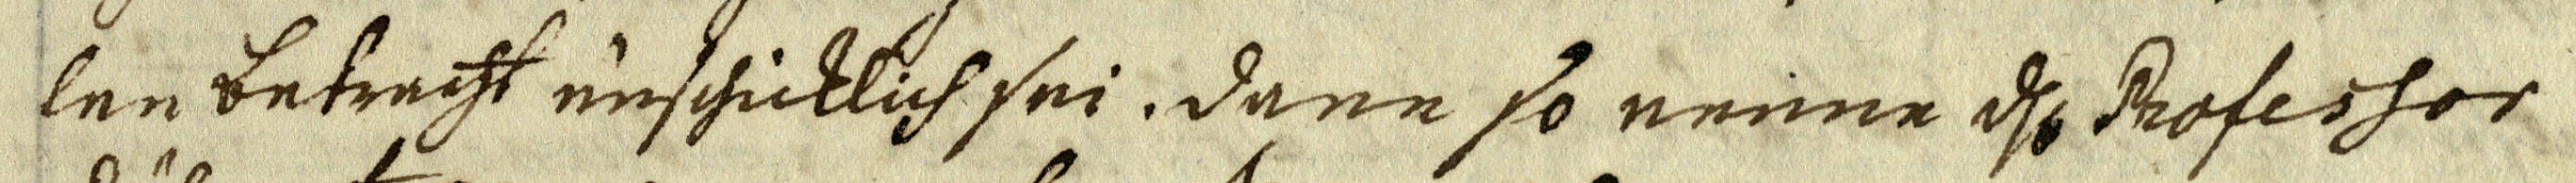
len Betracht unschicklich sei. Dann so nenne dh Professor
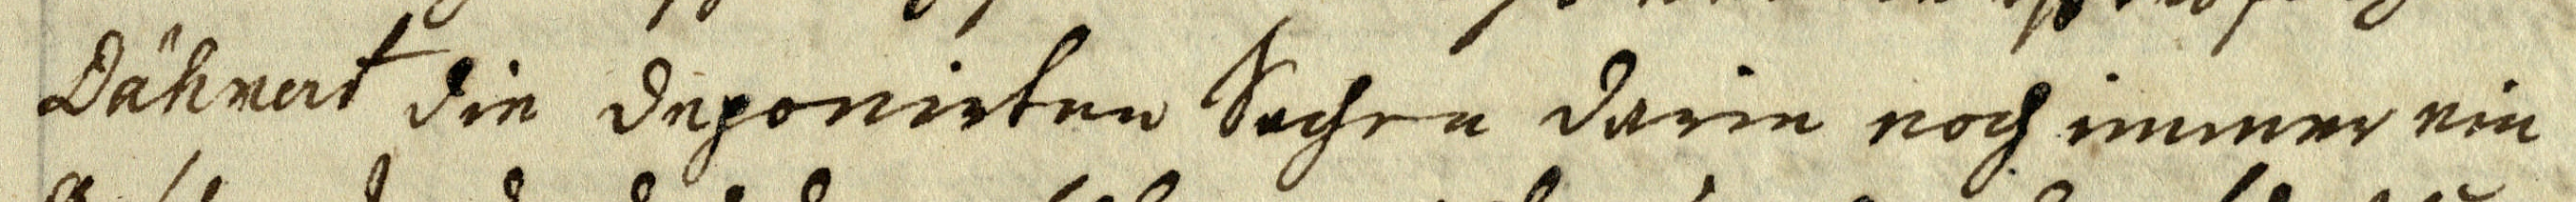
Dähnert die deponirten Sachen darin noch immer ein
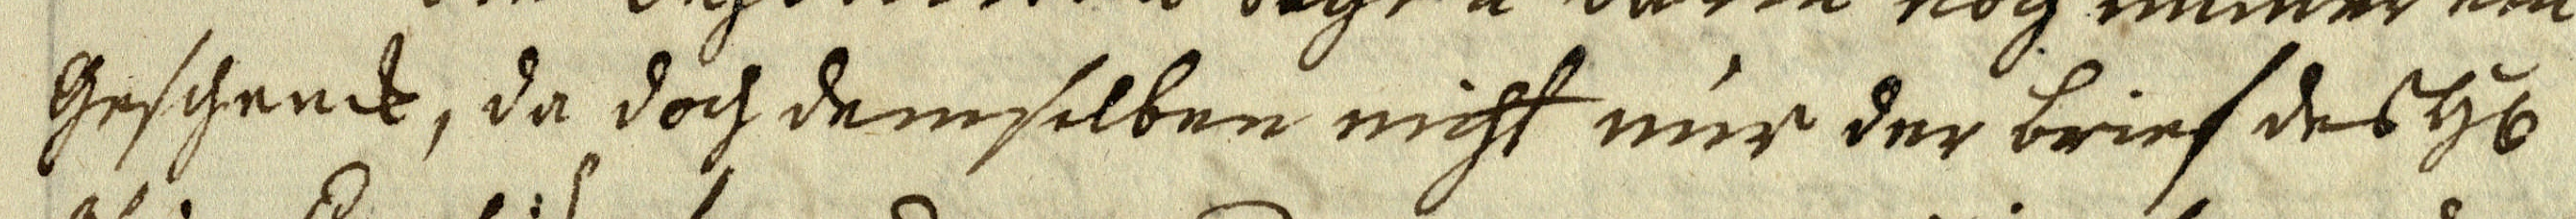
Geschenck, da doch demselben nicht nur der Brief dh
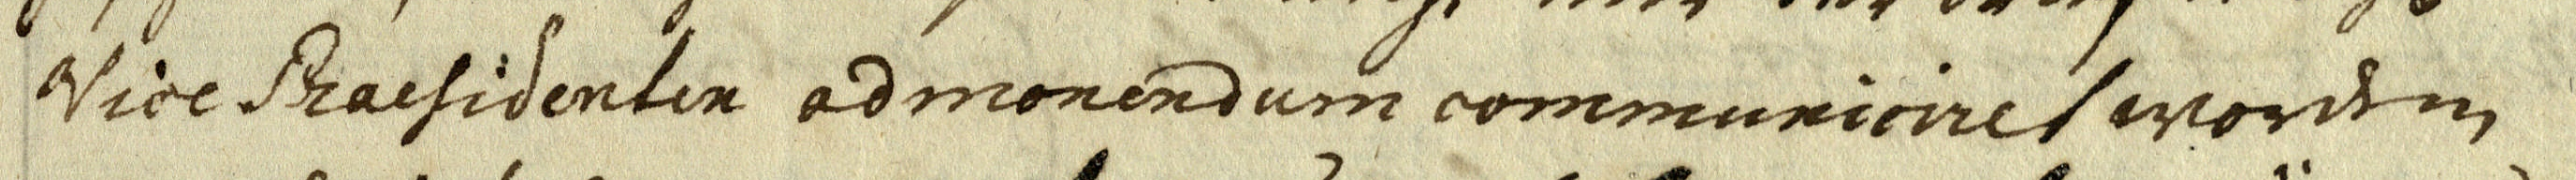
Vice Praesidenten ad monendum communiciret worden,
